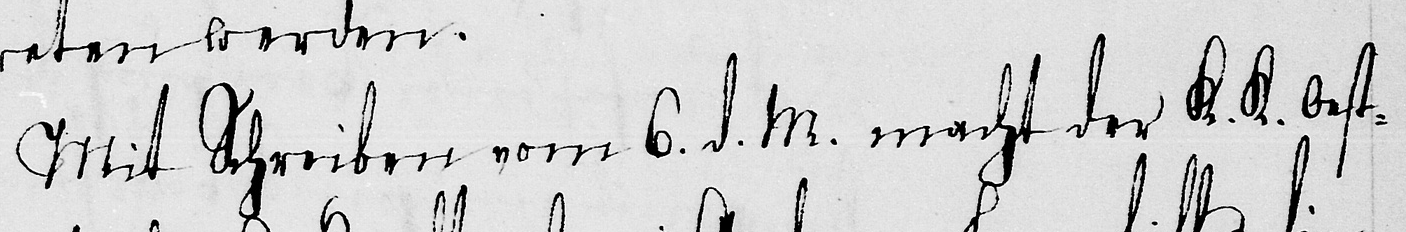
Mit Schreiben vom 6. d. M. macht der K. K. Oest¬
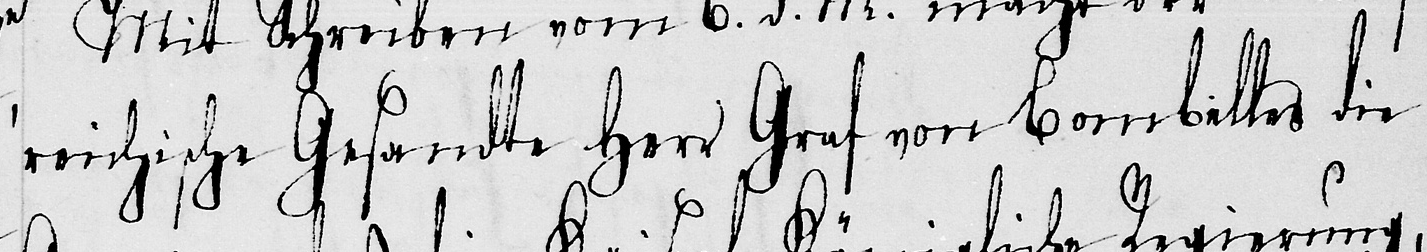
eichische Gesandte Herr Graf von Bombelles die
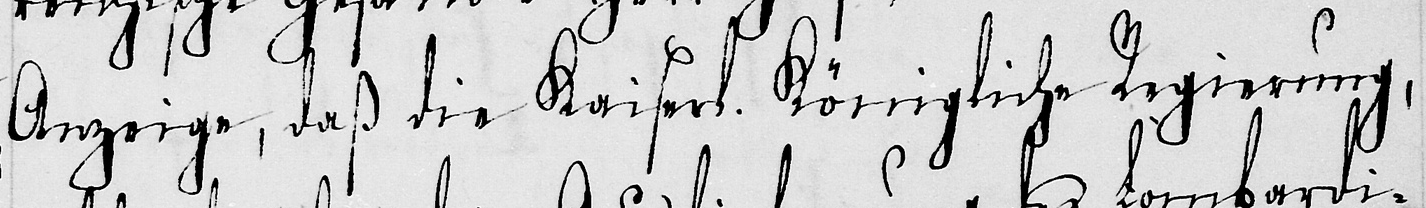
Anzeige, daß die Kaiserl. Königliche Regierung,
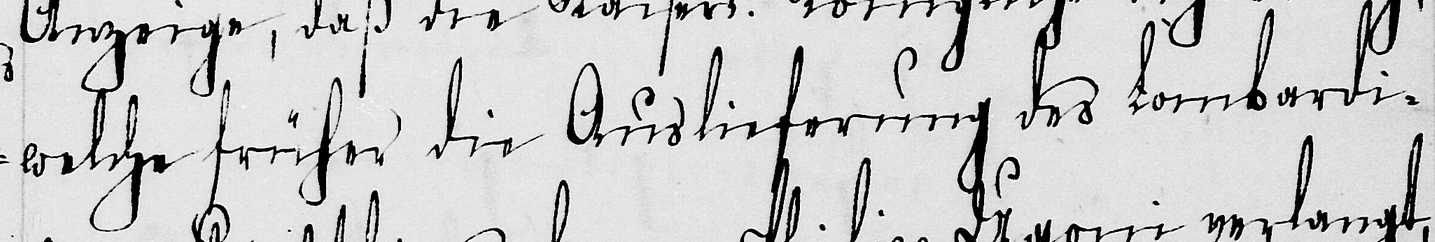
welche früher die Auslieferung des Lombardis¬
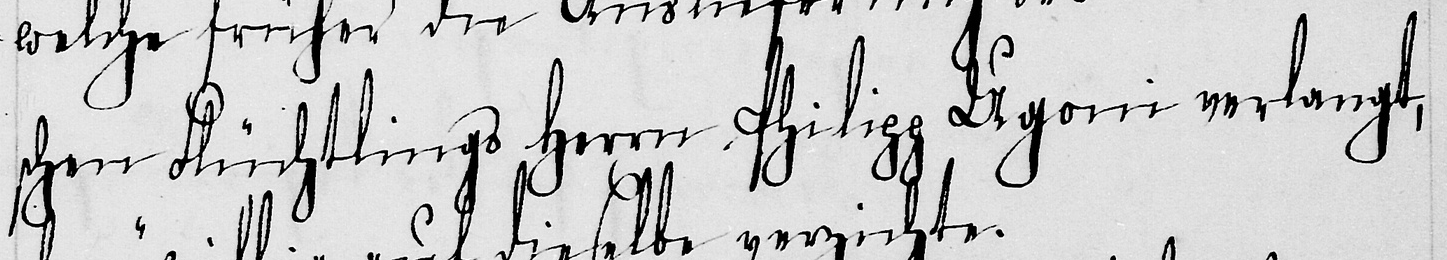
chen Flüchtlings Herrn Philipp Ugoni verlangt,
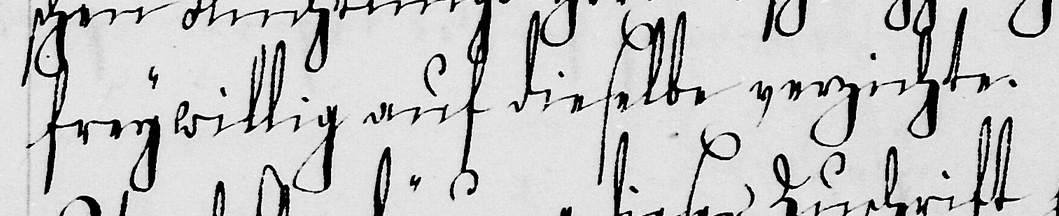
freywillig auf dieselbe verzichte.
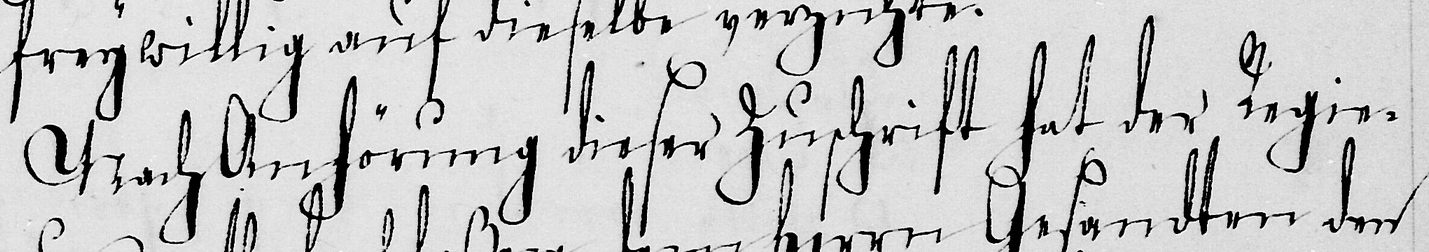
Nach Anhörung dieser Zuschrift hat der Regie¬
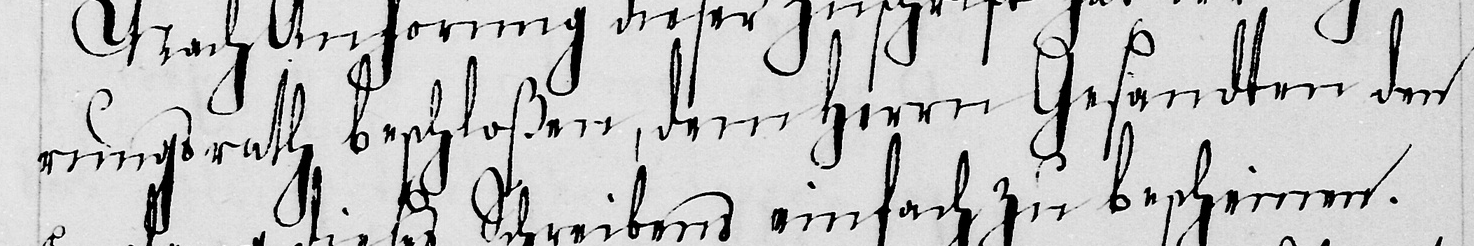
rungsrath beschloßen, dem Herrn Gesandten den
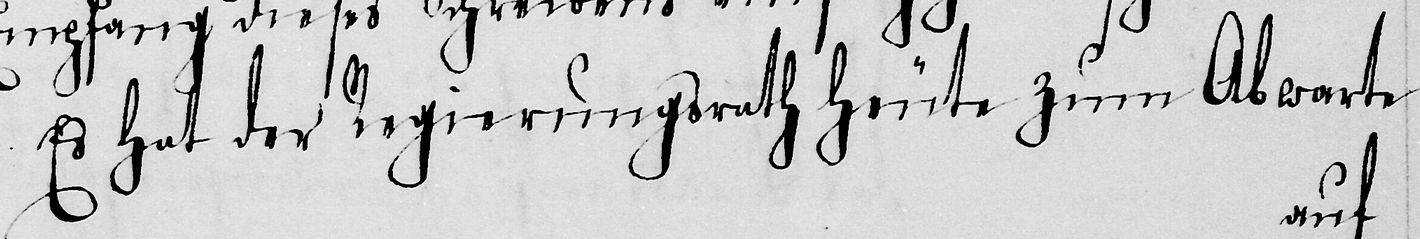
Es hat der Regierungsrath heute zum Abwarte
